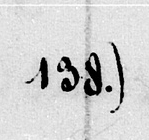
138.)
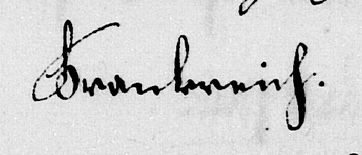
Frankreich.
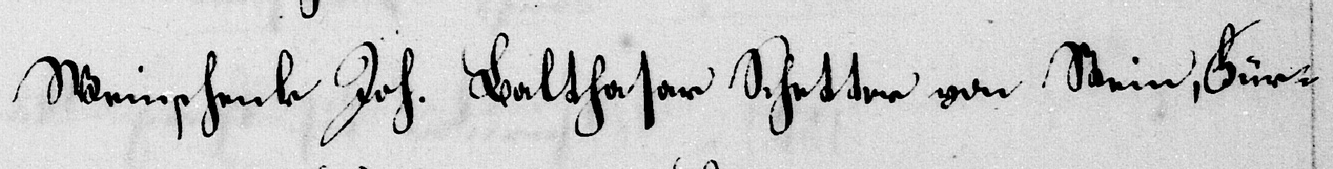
Weinschenk Joh. Balthasar Schetter von Stein, Für¬
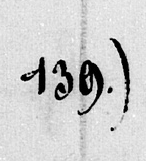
139.)
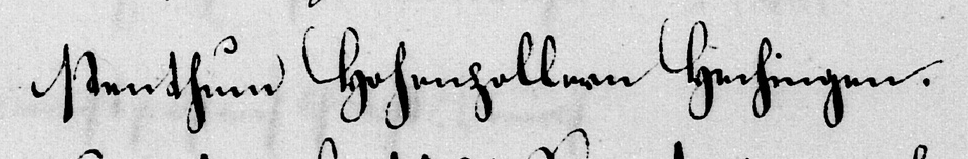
stenthum Hohenzollern Hechingen.
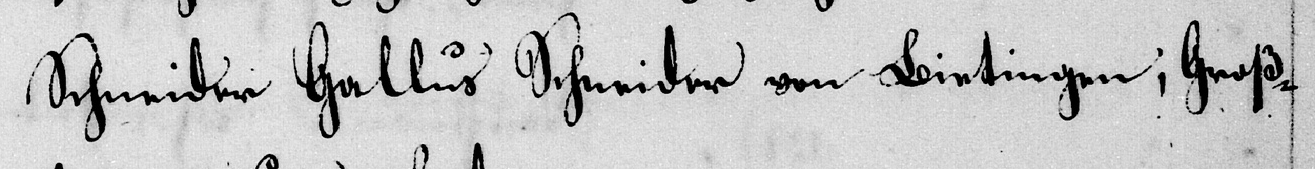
Schneider Gallus Schneider von Bietingen, Groß¬
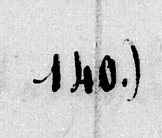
140.)
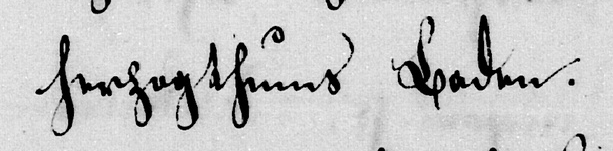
herzogthums Baden.
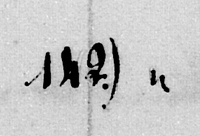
142.) “
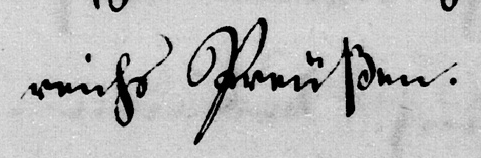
reichs Preußen.
